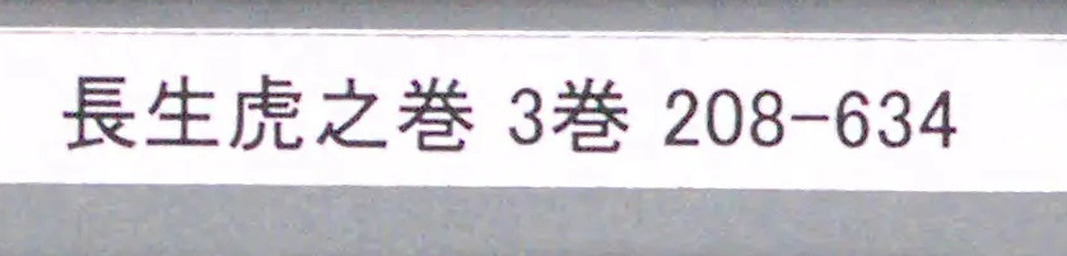長生虎之巻完

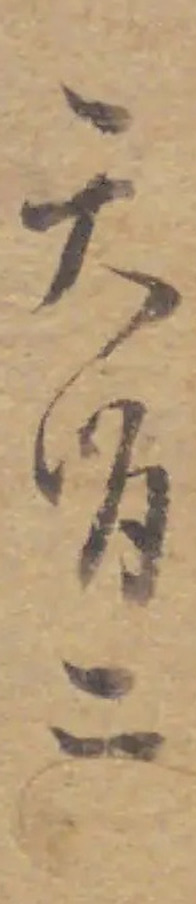天明二
